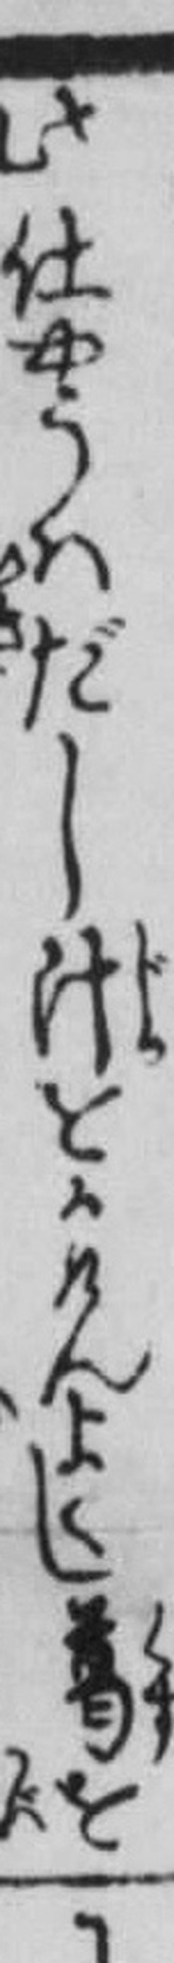此仕やうはだし汁をかけんよくし葛を
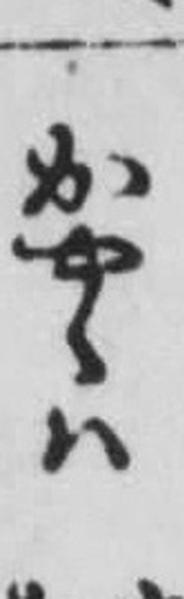かやくふ
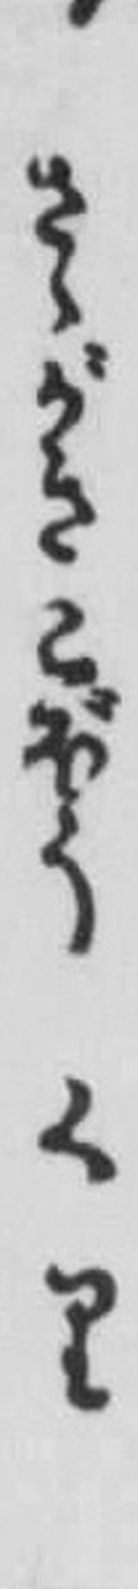さゝがきこぼうくり
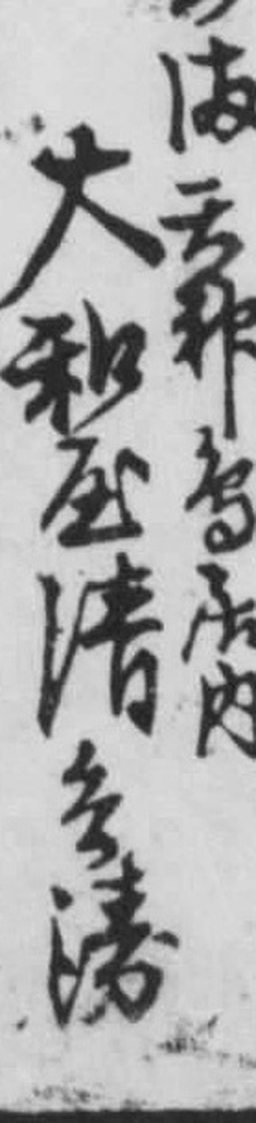太和屋清兵衛
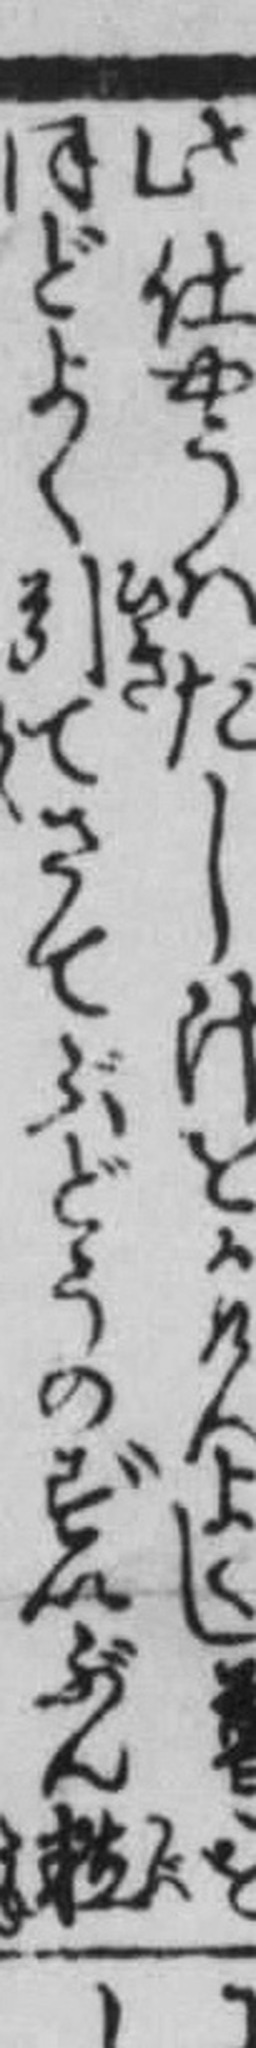ほどよく引てさてぶどうのずいぶん粒
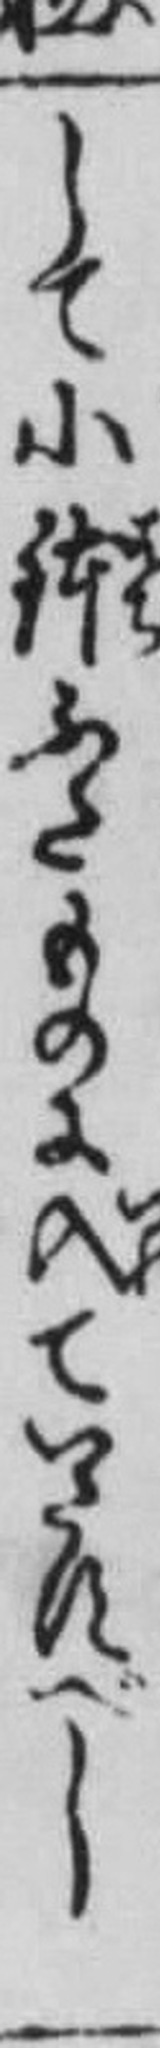して小鉢ふたものに入ていたすべし
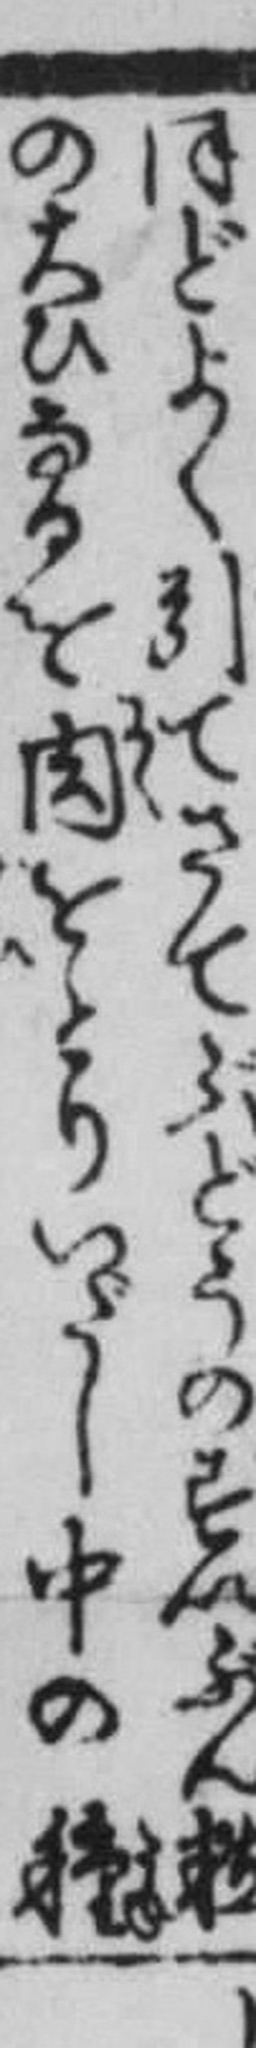の大ひなるを肉をとりいだし中の種
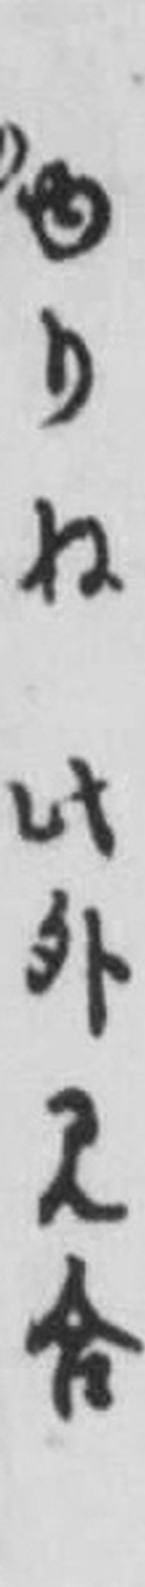ゆりね此外見合
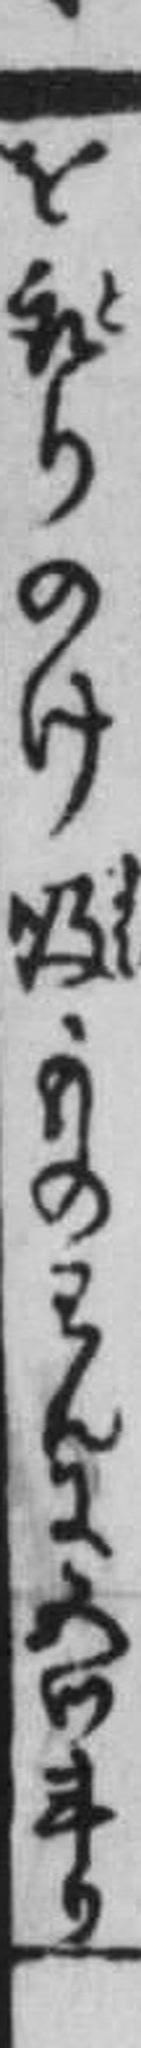を取りのけ吸ものわんに五つ斗り
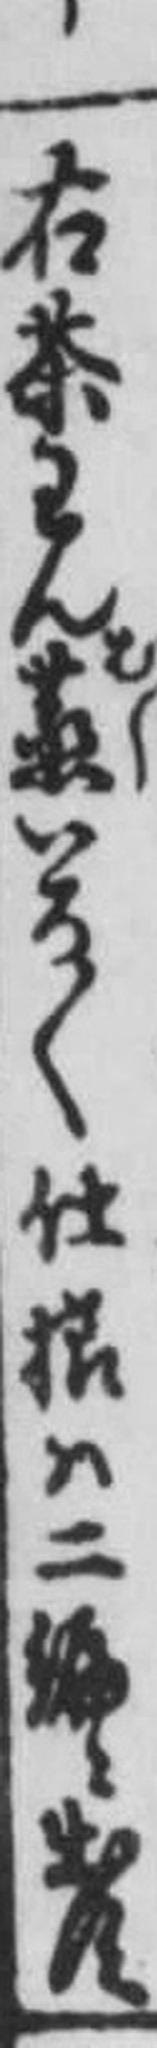右茶わん蒸いろ〳〵仕様は二編に出す
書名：日用重宝魚類精進/料理早工風
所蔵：大阪府立大学学術情報センター 国文学研究資料館
